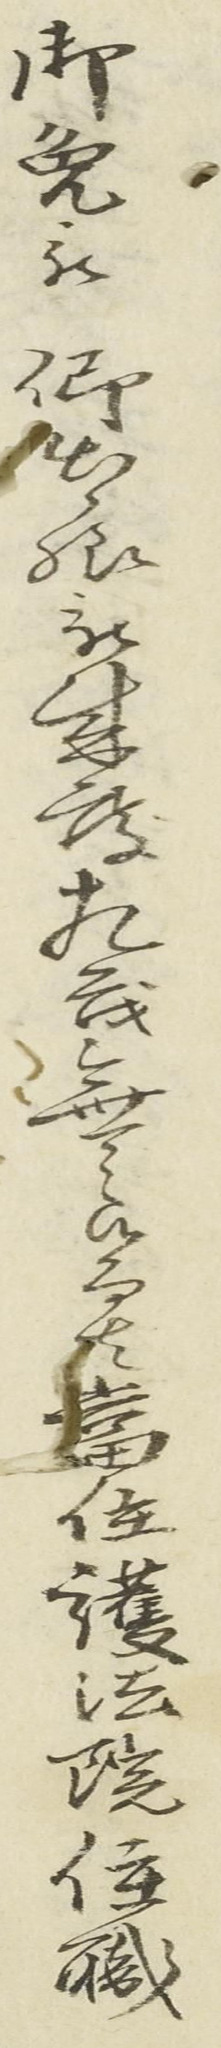御免被仰出候様被成度相茂無之候而は當住護法院住職
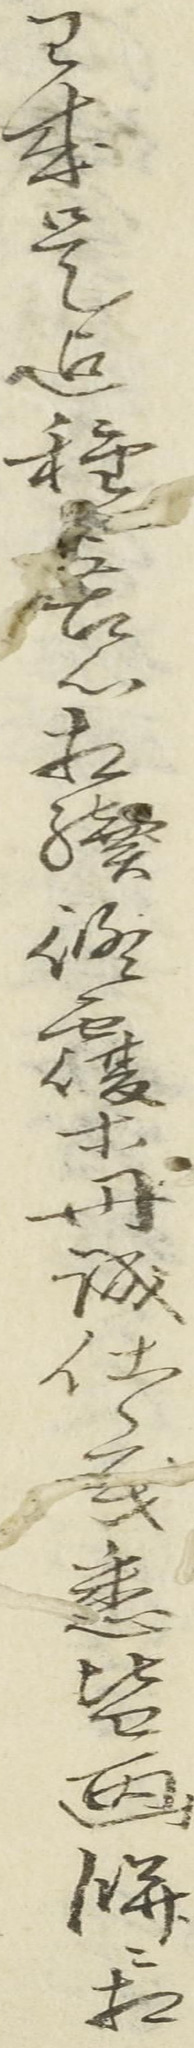已来是迄種々居心相続修覆等丹誠仕候義悉皆画餅ニ相
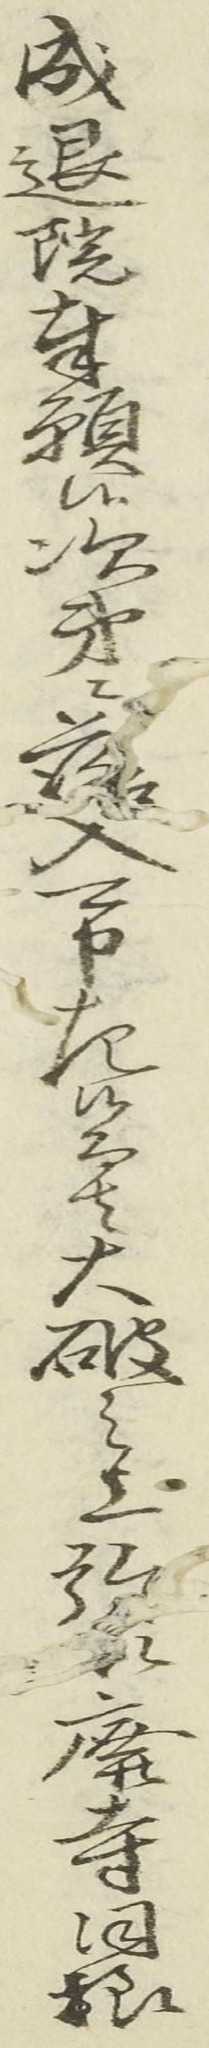成退院奉願候次第ニ落入可申左候而は大破之上弥以廃寺同様
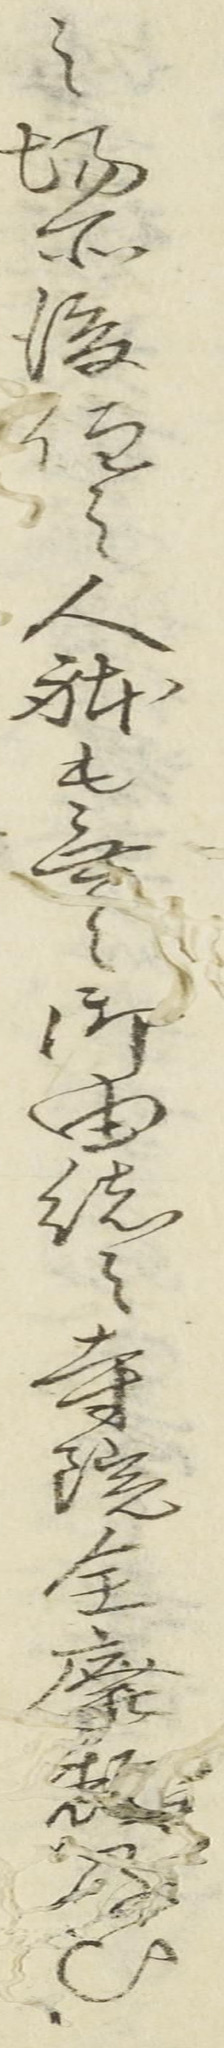之場所後住之人躰も無し御由緒之寺院全廃頽及ひ
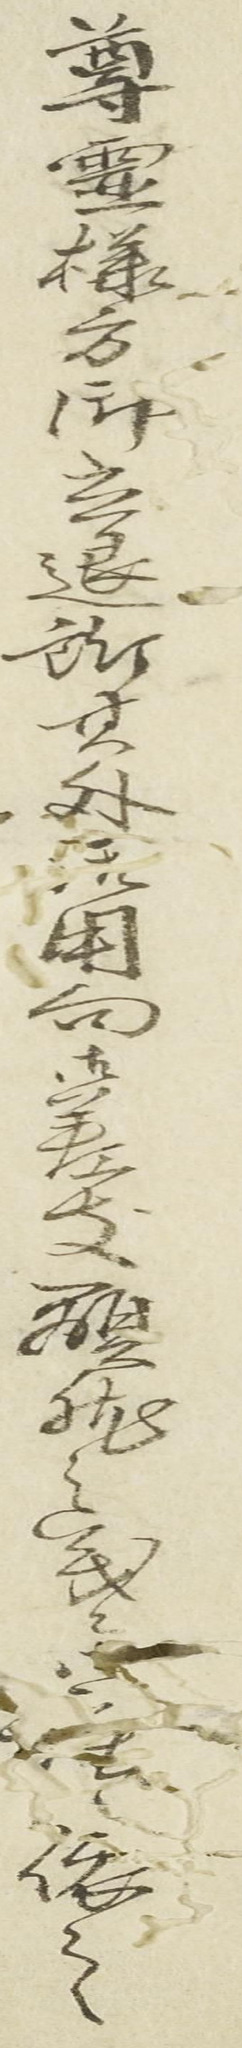尊霊様方御立退所其外御用向御差支顕然之義ニ御座候依之
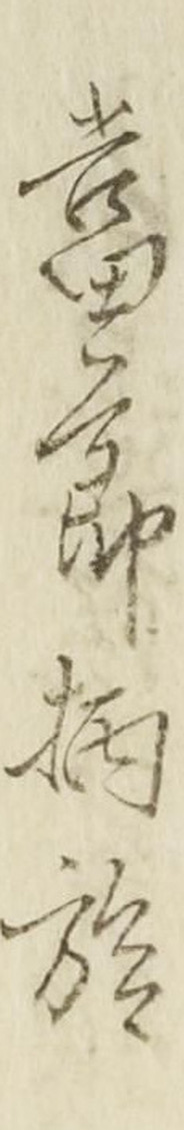當節柄於
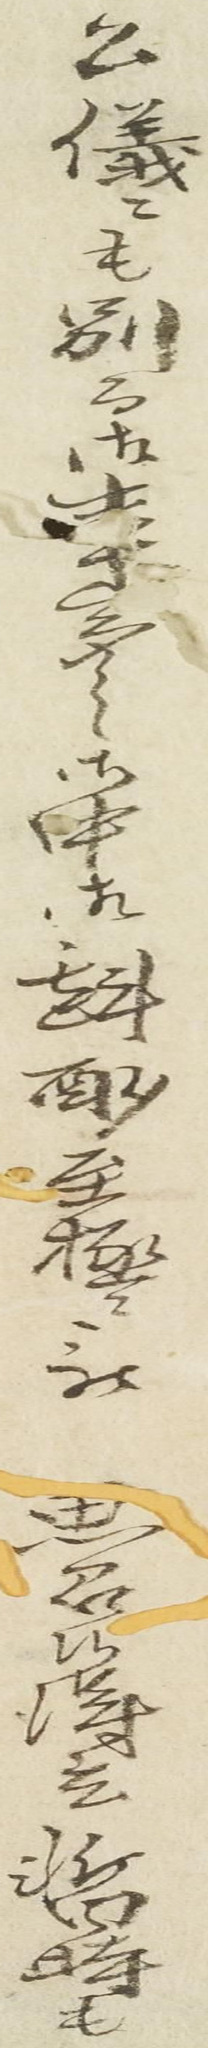公儀ニも別而多し御中御斟酌至極ニ被思召候得共暫時も
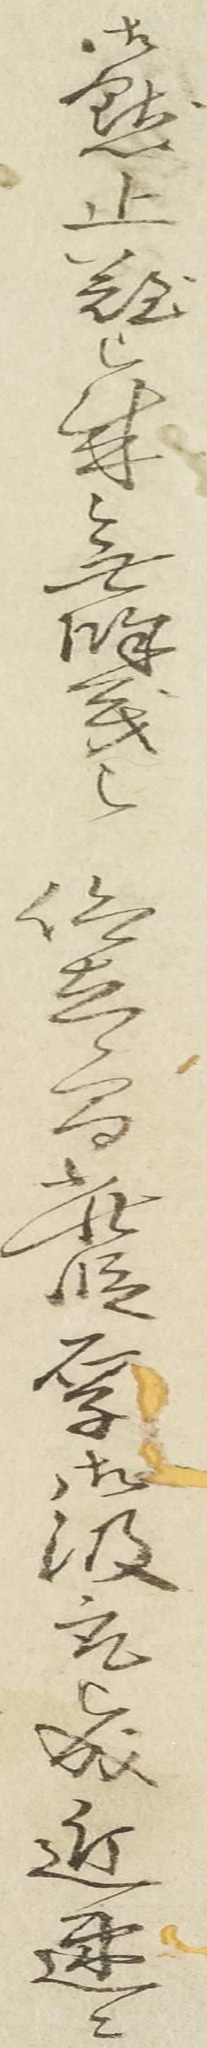御黙止難被成無餘義被仰立候間此段厚御汲取被成近速ニ
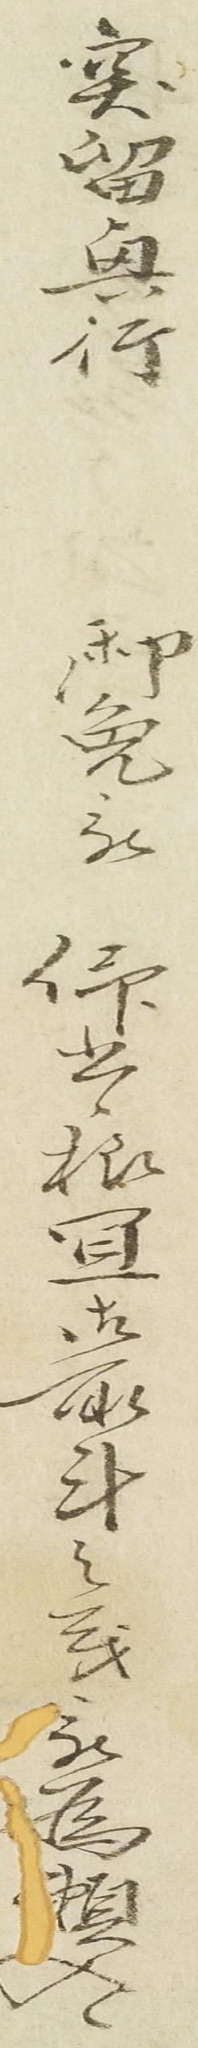突留興行御免被仰出候様宜御取斗之義被為頼入候
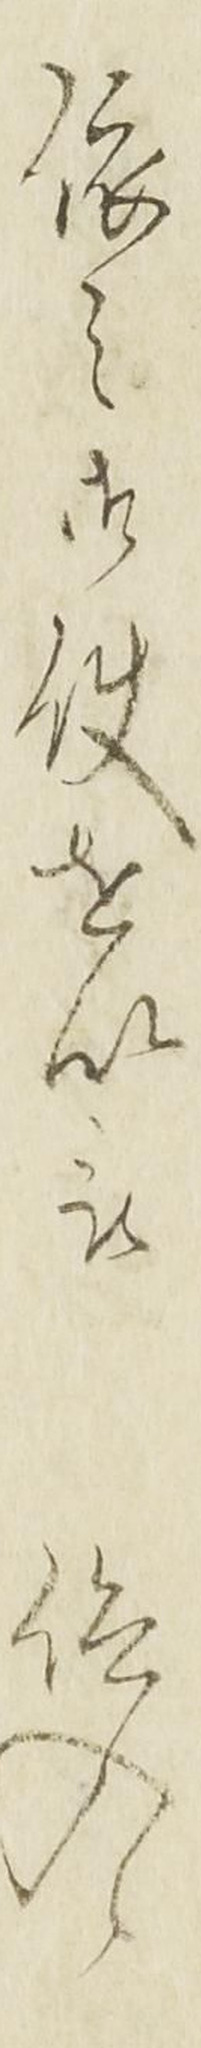依之御使を以被仰入候
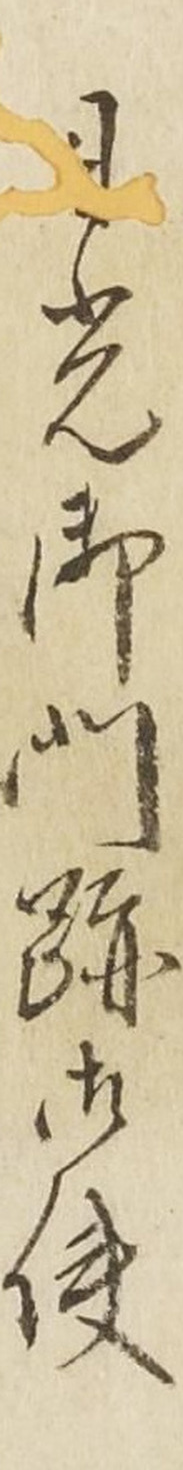日光御門跡御使
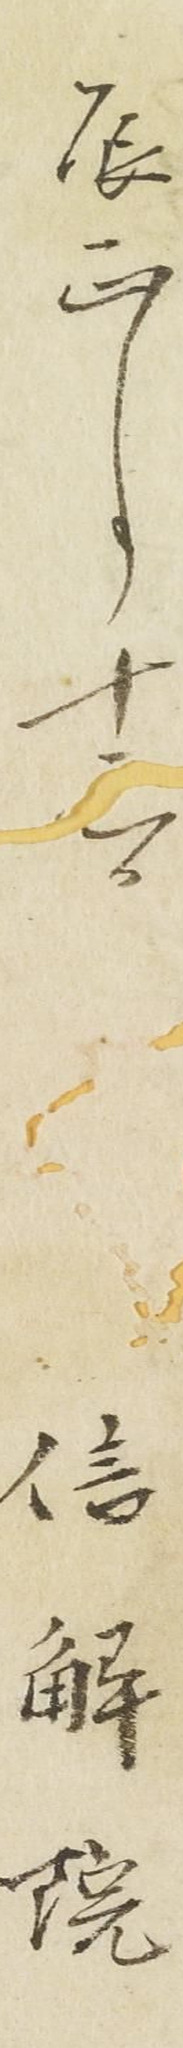辰正月十二日信解院
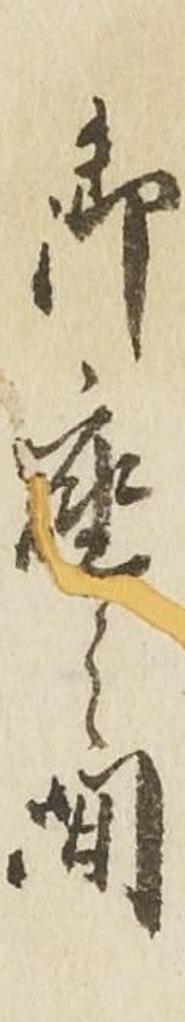御座之間
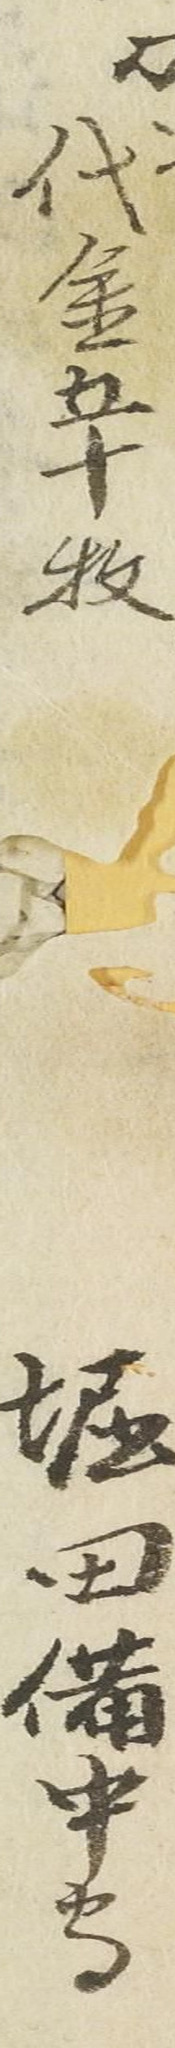代金五十枚堀田備中守
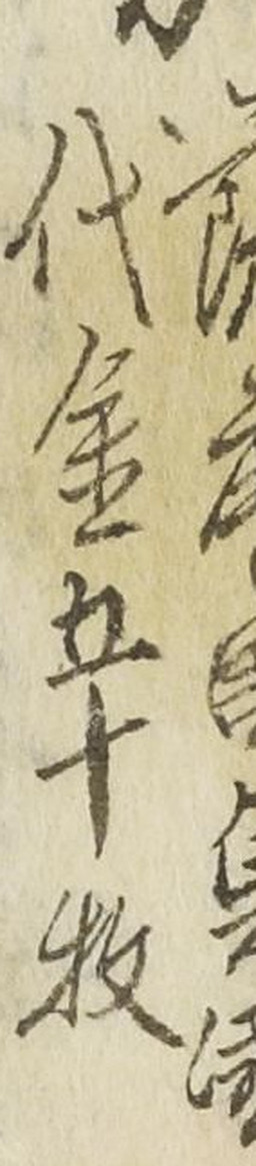代金十五枚
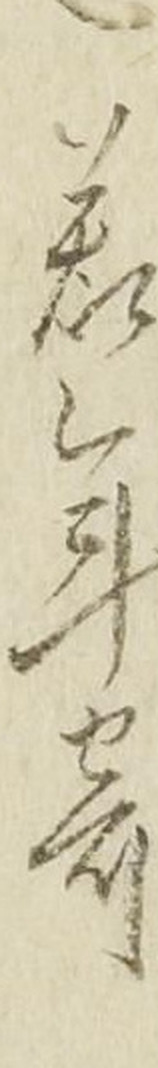若年寄
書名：安政二乙卯年十月二日大地震之事
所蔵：東京大学地震研究所図書室 Earthquake Research Institute Library, The University of Tokyo, JAPAN
